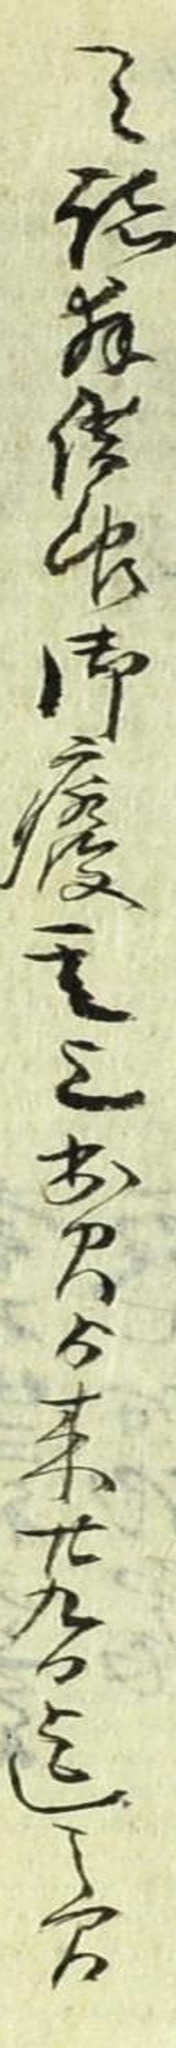之諸拝借銀御廃其上出火ゟ来廿九日迄之間
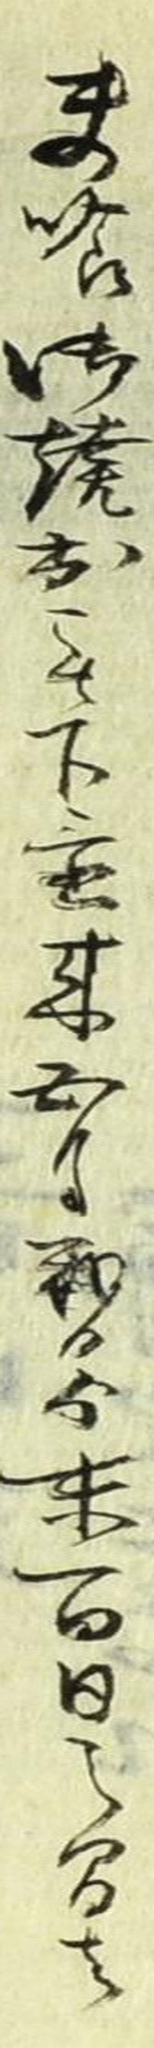夫喰御焼出被下置来正月朔日ゟ末百日之間者
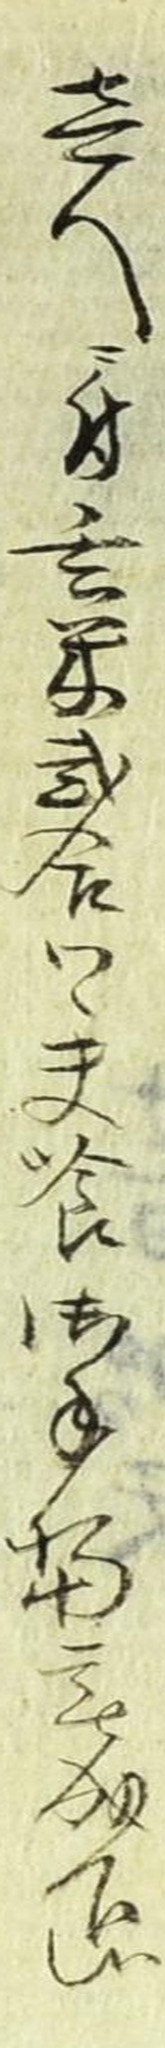壱人ニ付玄米弐合ツヽ夫喰御手当被成下候
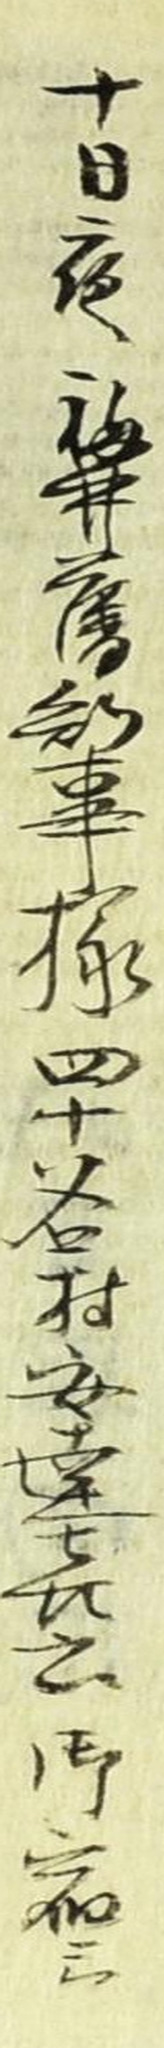十日夜福井藩知事様四十谷村安達喜六御宿ニ而
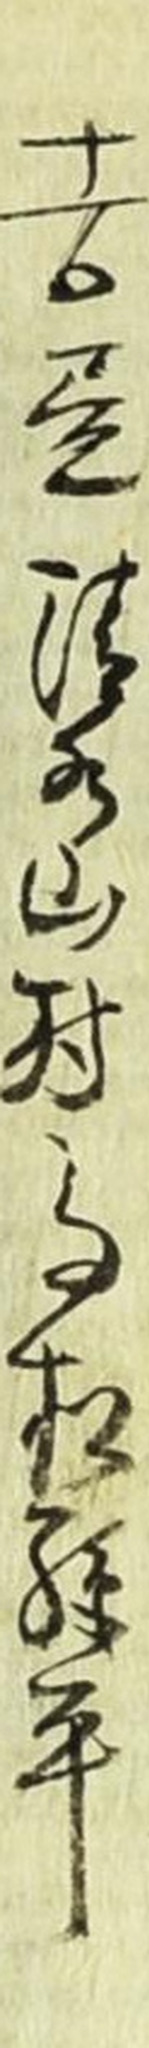十一日昼清水山村高松孫平
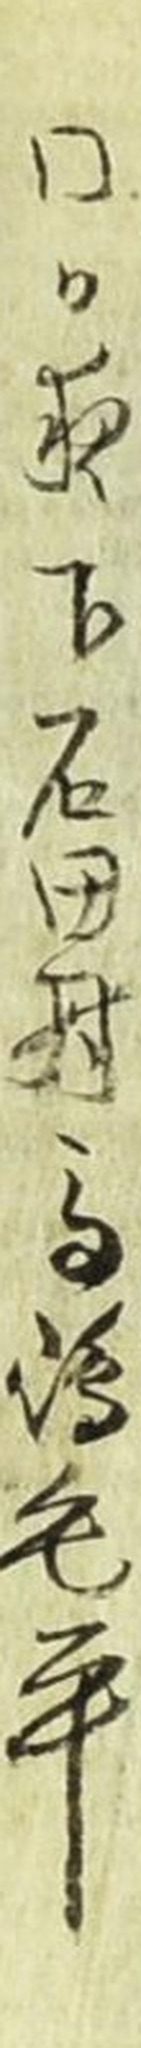同日夜下石田村高島午平
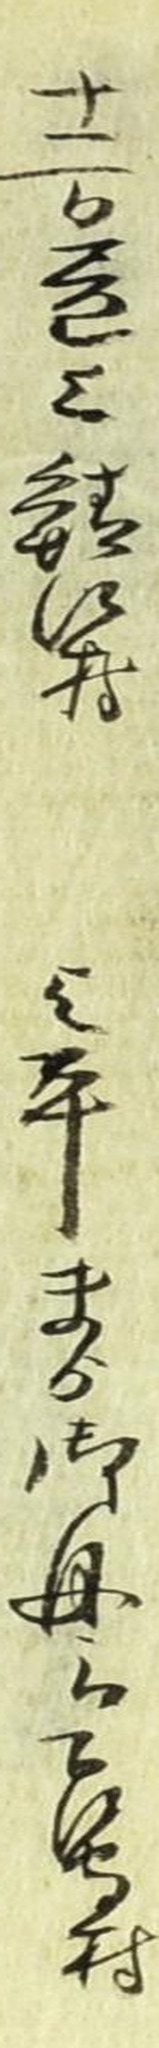十二日昼上鯖江村与平夫ゟ御舟ニ而下江守村
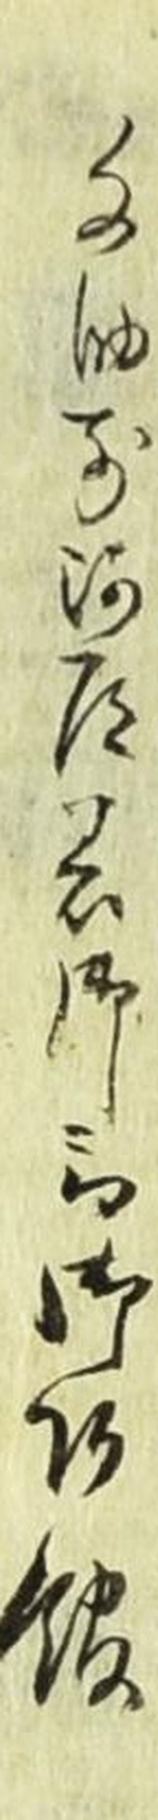久助前河道着御ニ而御帰館

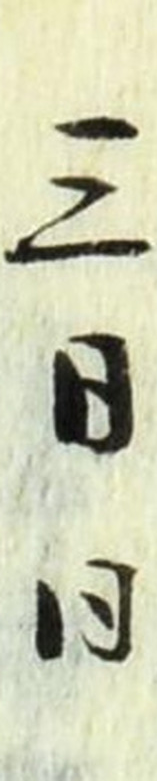五日同
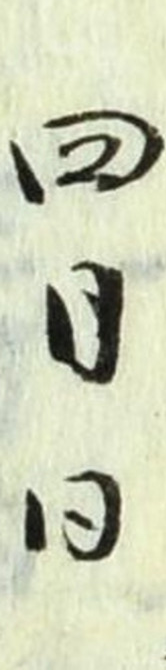五日同
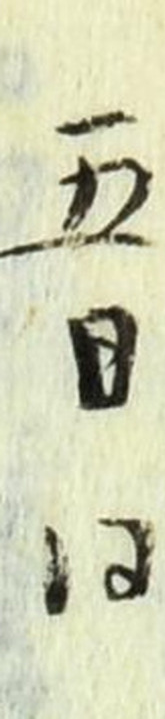五日同
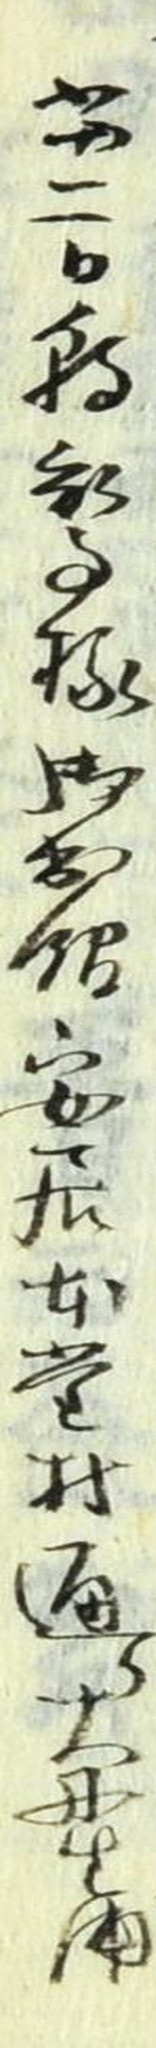当二日朝知事様御出館安居本堂村通り大丹生浦
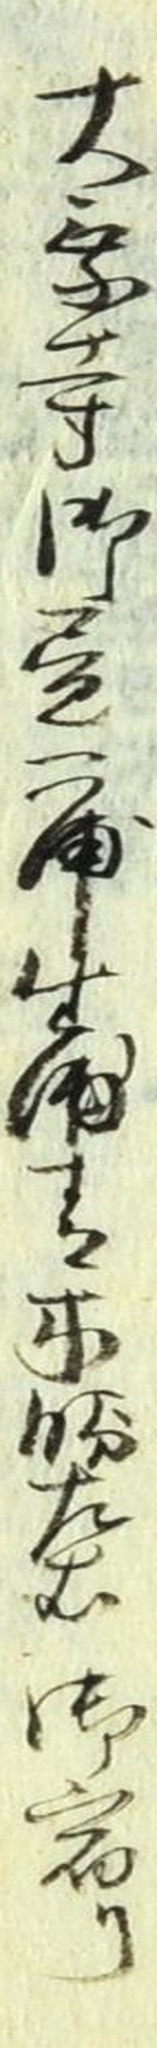大乗寺御昼二浦蒲生浦青木師左右御宿り
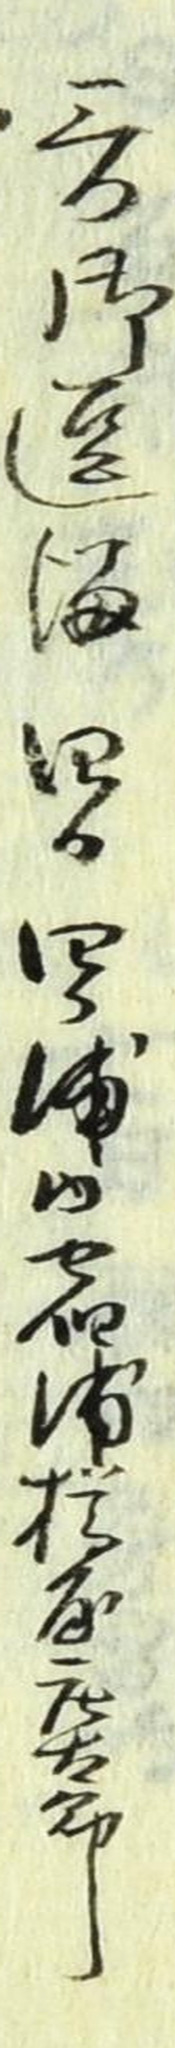三日御逗留四日四ツ浦内宿浦樽屋庄太郎
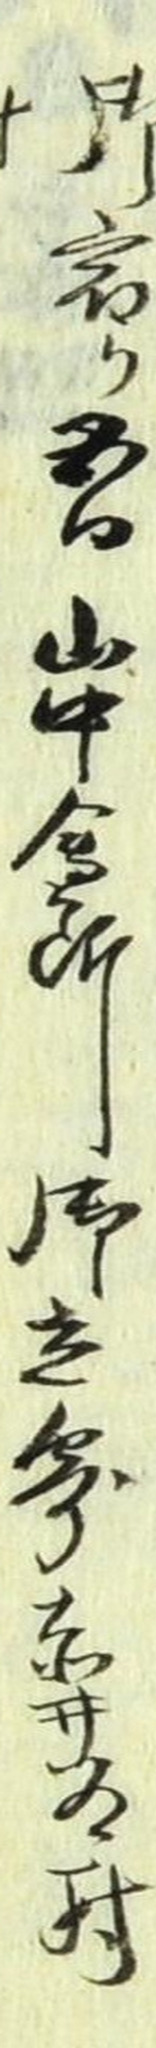御宿り五日山中会所御立寄赤井谷村
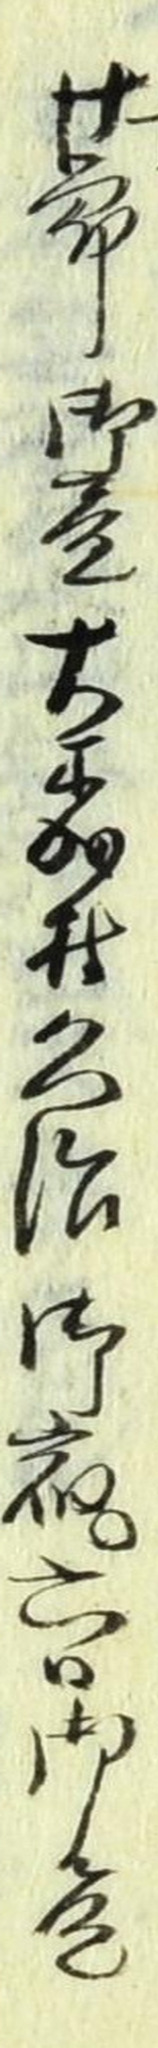廿郎御昼大森村久作御宿六日御昼
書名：（日記）
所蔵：福井県文書館 Fukui Prefectural Archives
